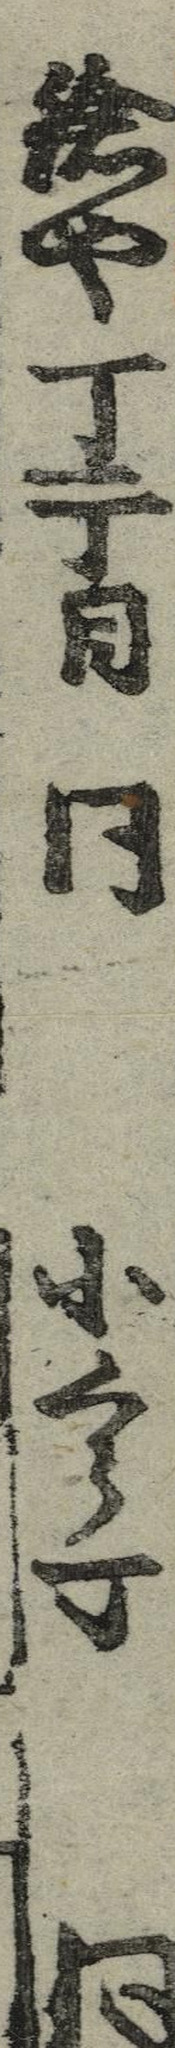鎗や丁一丁目同小くら丁同
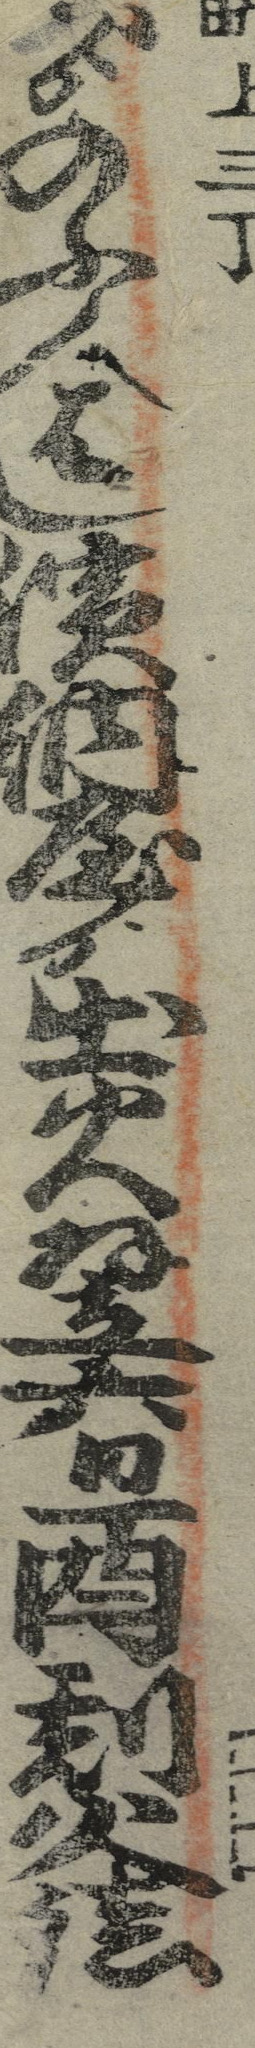十二月ゟのふ人はし僓納屋ゟ出火翌六日酉刻火鎮
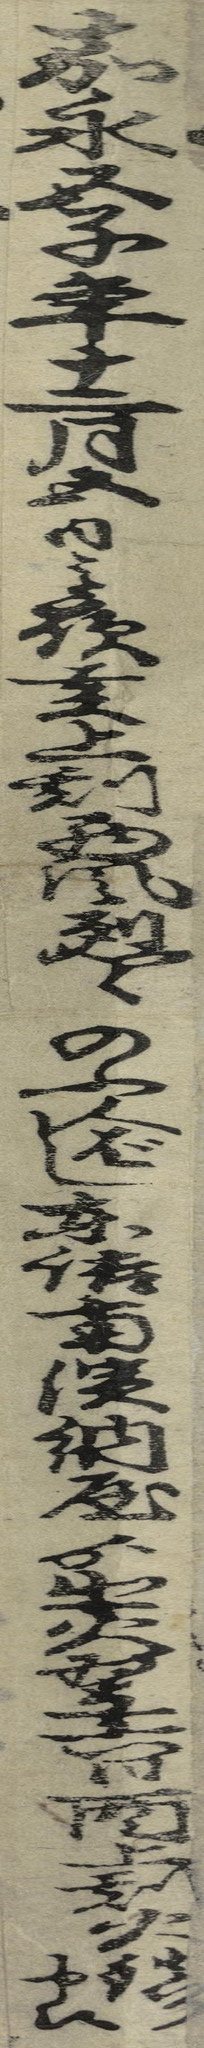嘉永五子年十二月五日之夜亥上刻西風烈くのふ人ばし東詰僓納屋ゟ出火翌六日酉上刻火鎮り申候
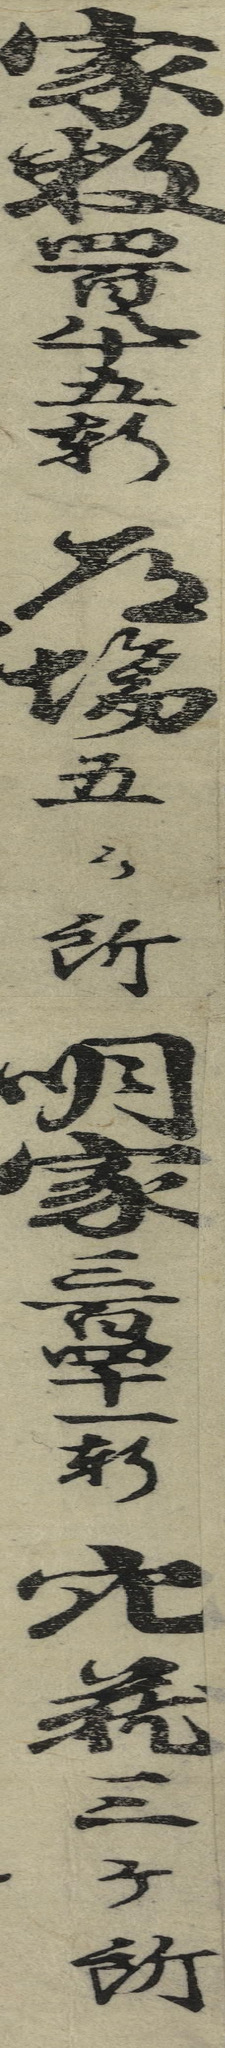家数四百八十五軒道場五ケ所明家三百四十一軒穴蔵三ケ所
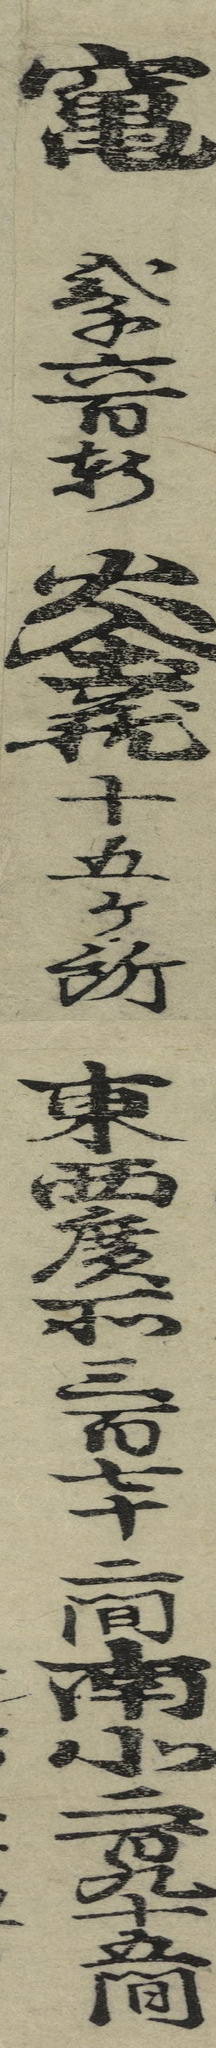竈弐千六百軒火入土蔵十五ケ所東西廣所三百七十二間南北二百九十五間
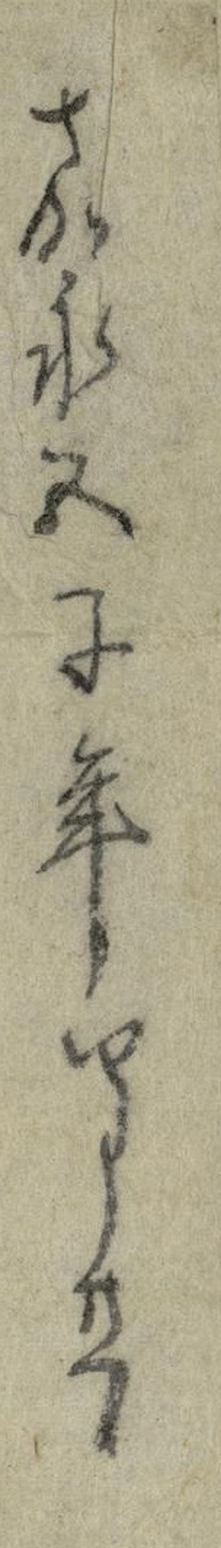嘉永五子年ノ四月廿日
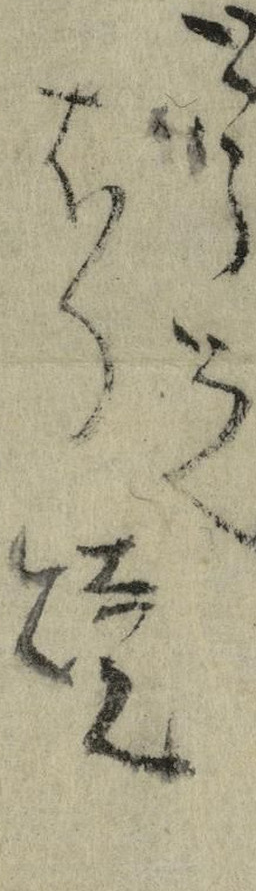ほり焼
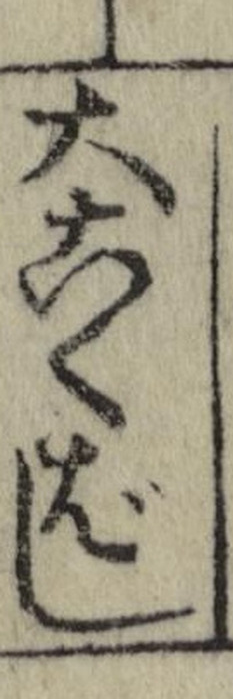大こくばし
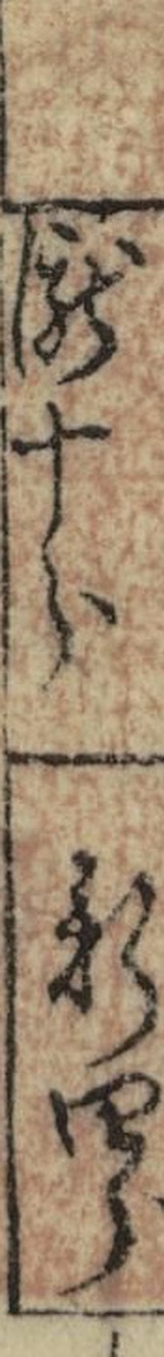新十郎新四郎
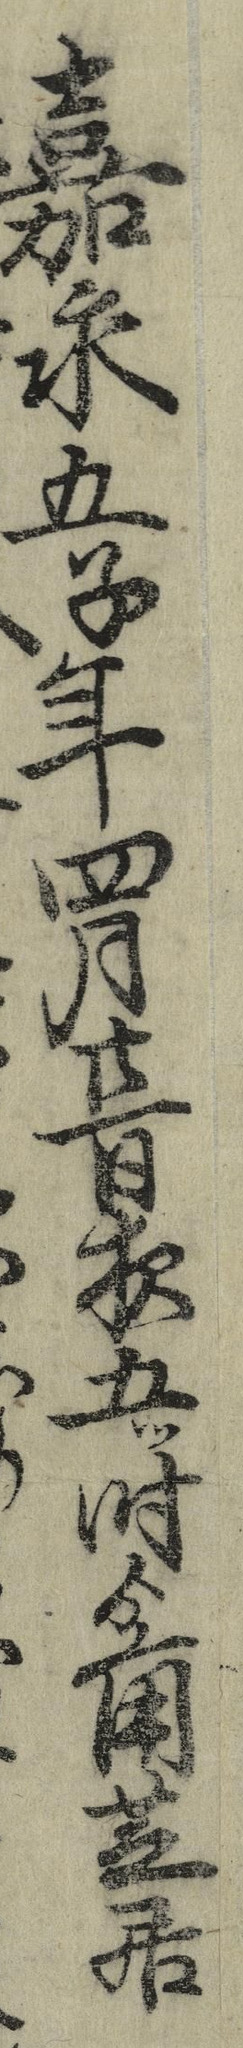嘉永五子年四月廿一日夜五ツ時ゟ角芝居
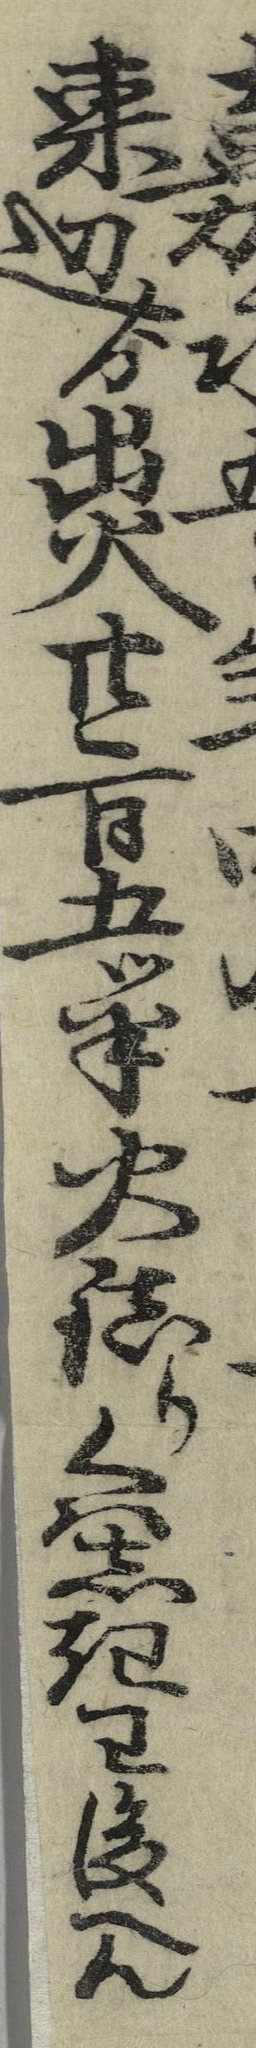東辺ゟ出火廿ニ日五ツ半火鎮りくはしきわ後へん
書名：[大阪上町出火略圖］
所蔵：東京大学地震研究所図書室 Earthquake Research Institute Library, The University of Tokyo, JAPAN
